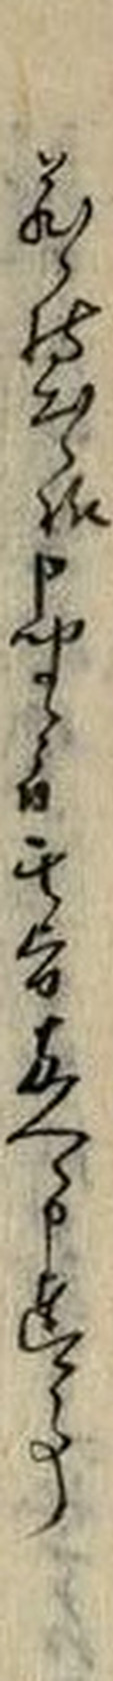蔵へ持出候様申聞候ニ付其旨両人へ申達候事
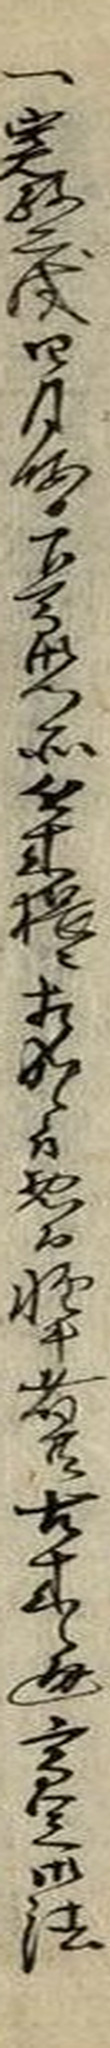一寛政二戌四月晦日下馬御門所近来猥ニ相成候ニ付惣而軽キ者共古来之通高足御法
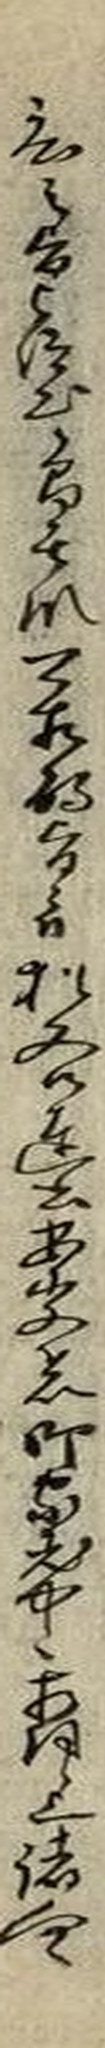度之旨被仰出候間其段可相触旨ニ付猶又達書案文を以御家老中へ相伺候上諸向へ
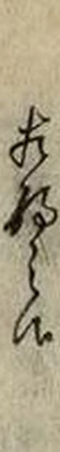相触之候
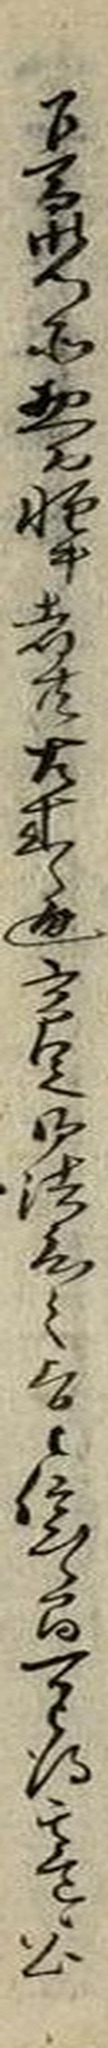下馬御門所惣而軽キ者共古来之通高足御法度之旨被仰出候間可被得其意候以上
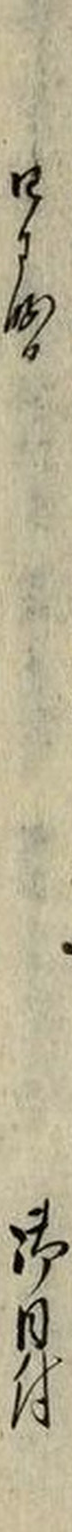四月晦日御目付
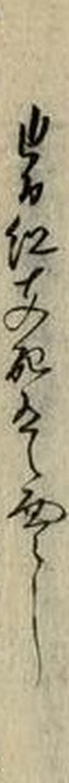追而組支配有之面々
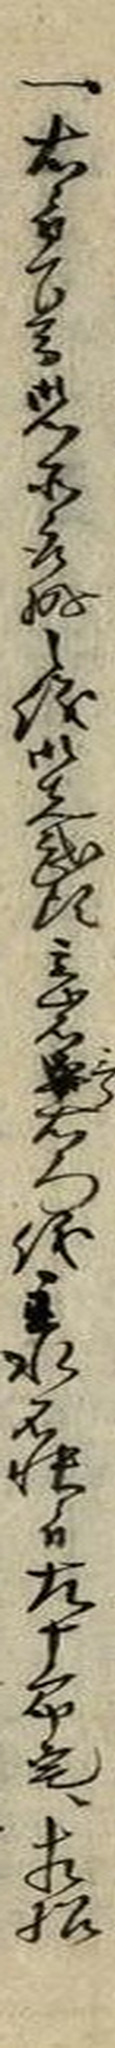一右ニ付下馬御門所取扱之儀御先武頭立岩三郎右衛門儀主水不快ニ付左十郎宅へ相招
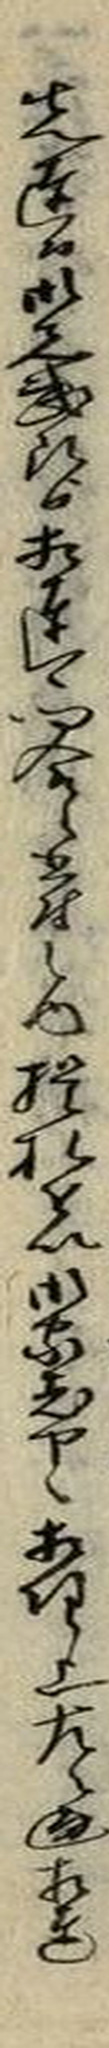先達而御先武頭ゟ相達候問合之書付之内提札を以御家老中へ相伺候上左之通相達
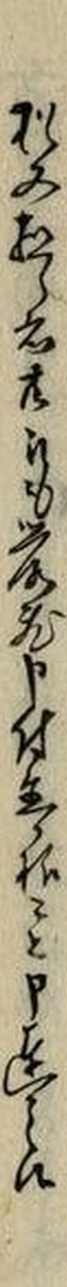猶又組之者共江も厳敷申付置候様ニと申達之候
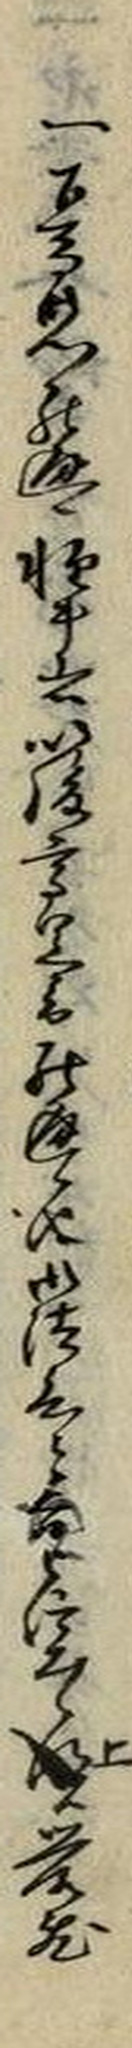一下馬御門罷通候軽キ者以後高足ニ而罷通候儀御法度ニ候旨被仰出候上ハ厳敷
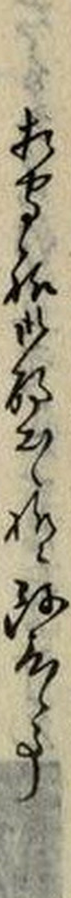相守候様御触出候様ニ致度候事
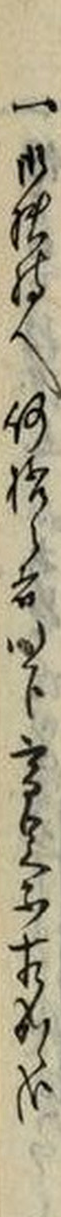一御扶持人何格之者以下高足不相成候哉
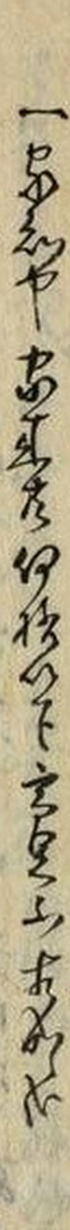一家知中家来共何格以下高足不相成候哉
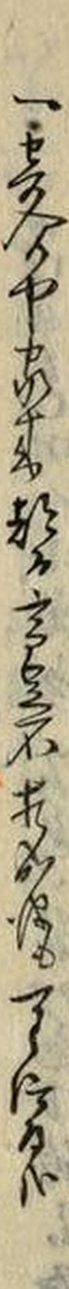一寄合中家来都而高足不相成儀も可被仰付哉
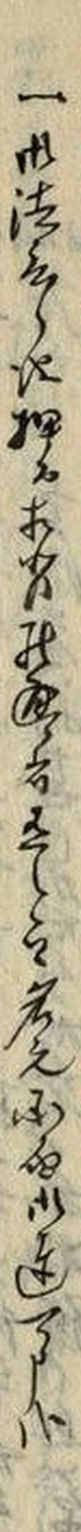一御法度之儀押而相背罷通候者有之候ハヽ名元承届御達可申哉
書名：御門御櫓之部
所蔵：福井県文書館 Fukui Prefectural Archives
